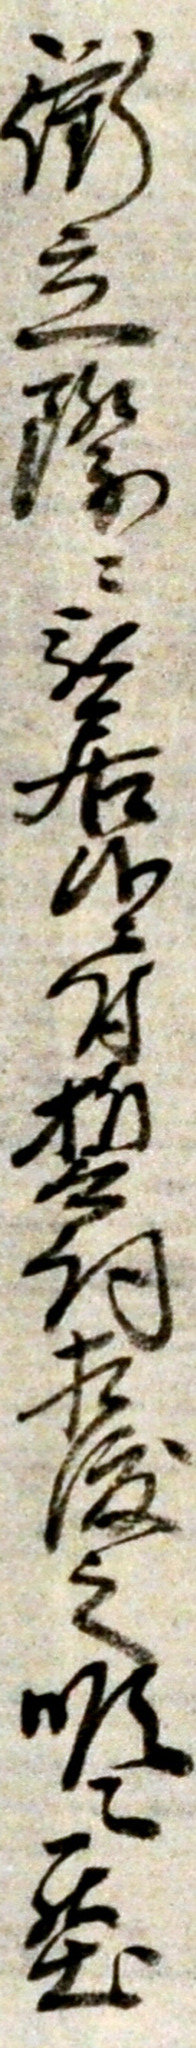衝立際ニ被居候二付誓詞相渡之順々罷出
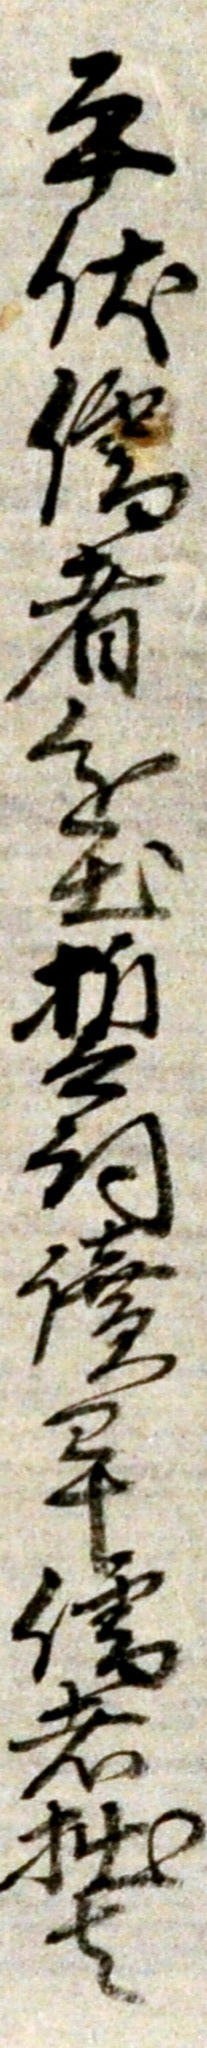平伏儒者進出誓詞讀卆儒者拙者
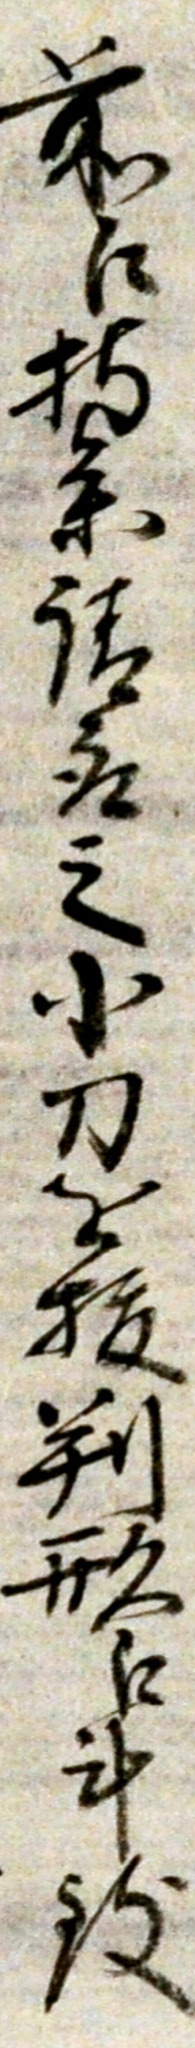前江持参請取之小刀を抜判形江斗致
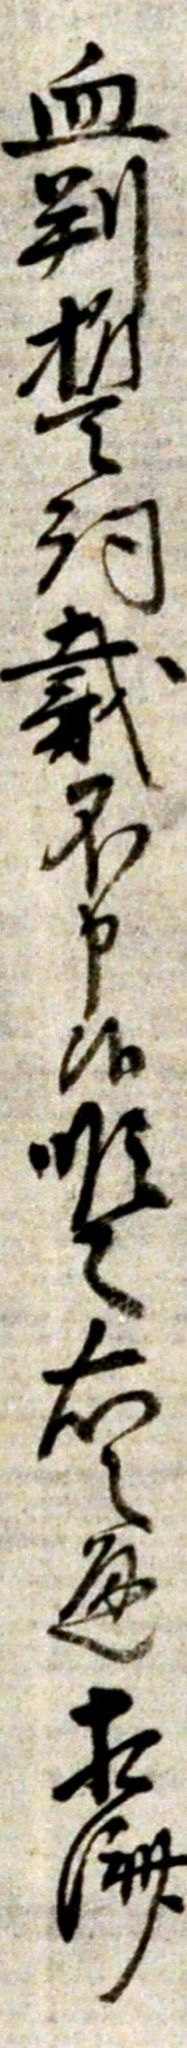血判誓詞戴不申候段之右之通相済
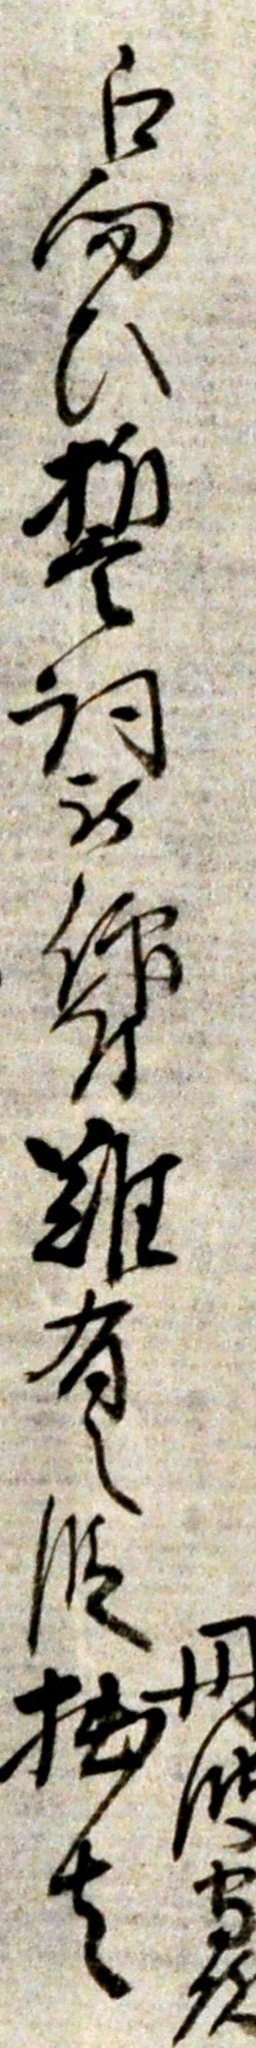江向ひ誓詞被仰付難有之段拙者
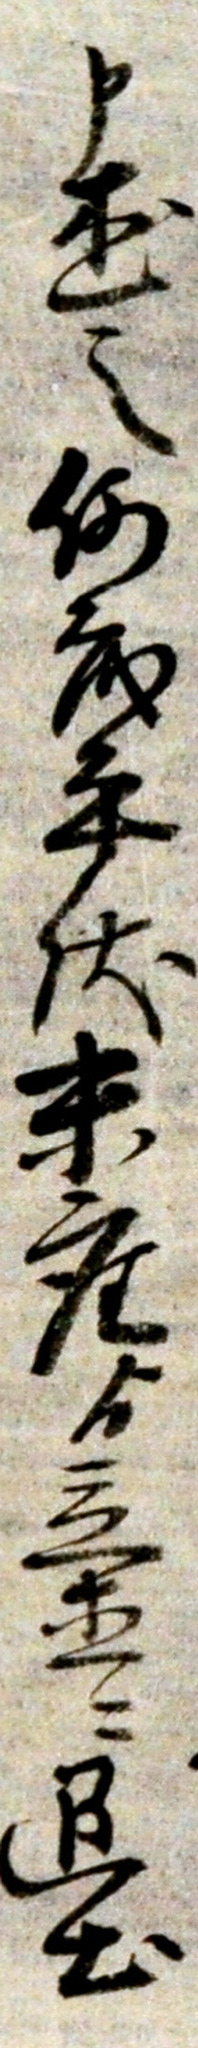申述之何茂平伏末座ゟ立直二退出
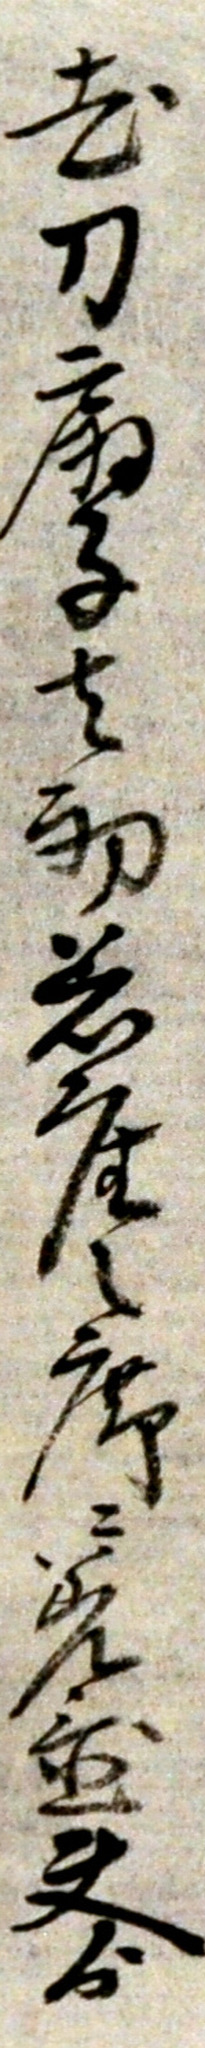尤刀扇子者初着座之席二差置夫ゟ
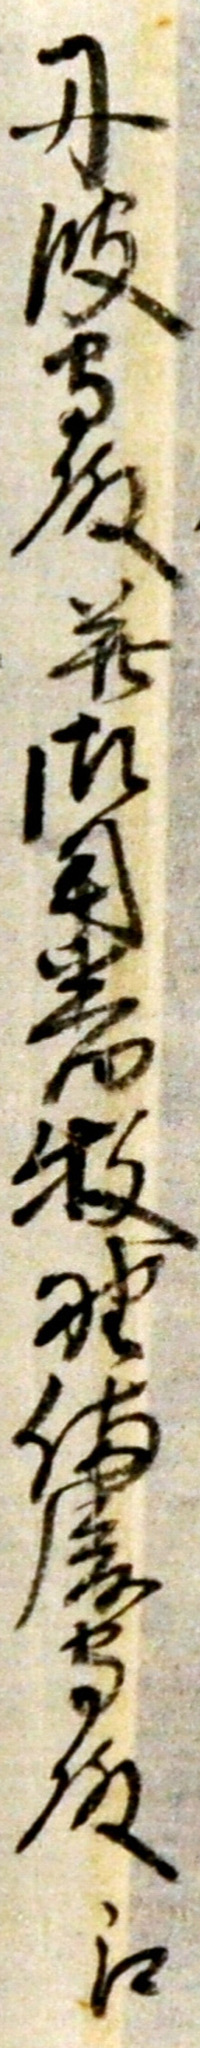丹波守殿幷御用番牧野備後守殿江

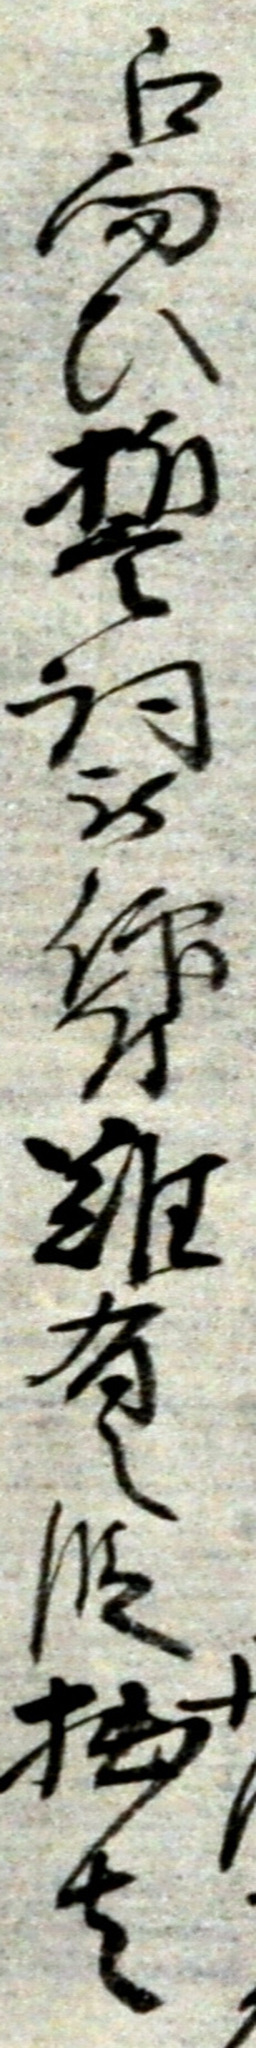江向ひ誓詞被仰付難有之段拙者
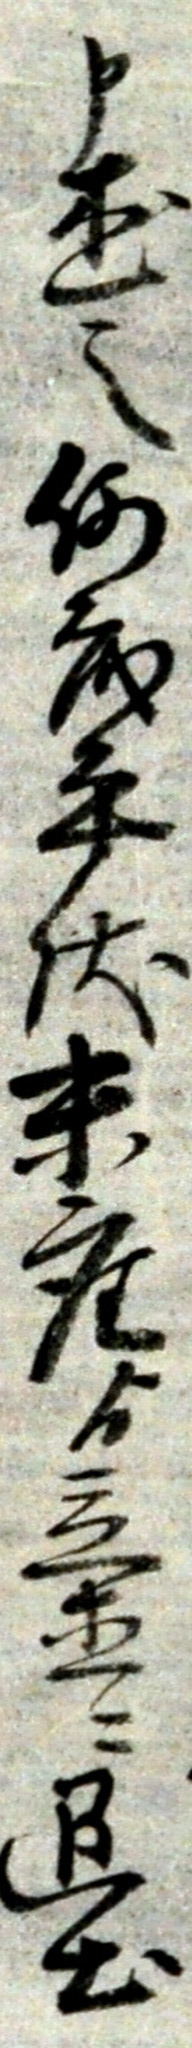申述之何茂平伏末座ゟ立直ニ退出
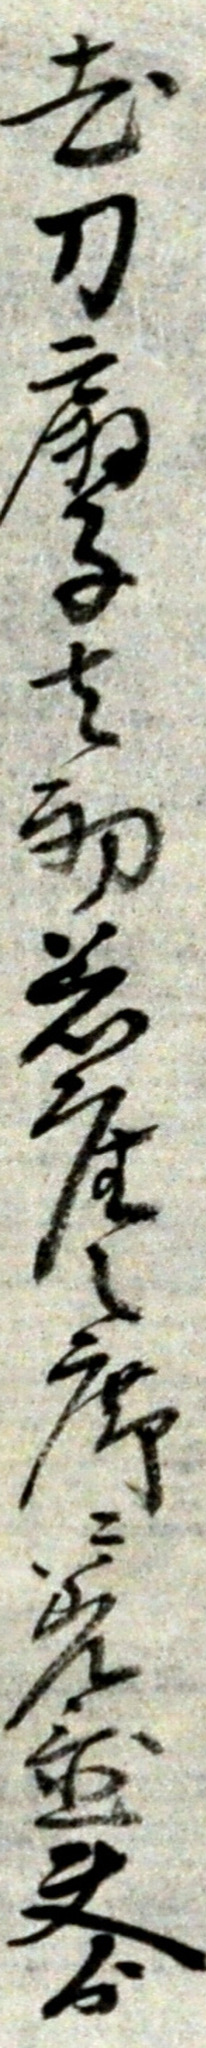尤刀扇子者初着座之席二差置夫ゟ
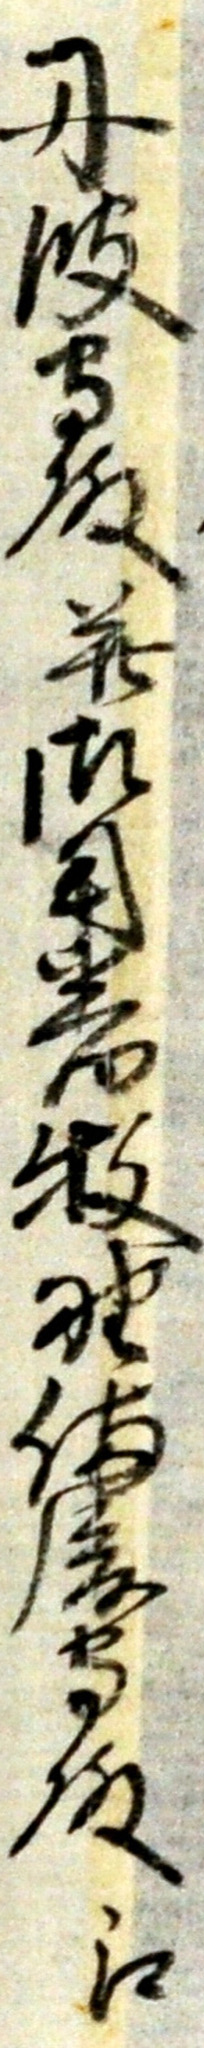丹波守殿幷御用番牧野備後守殿江
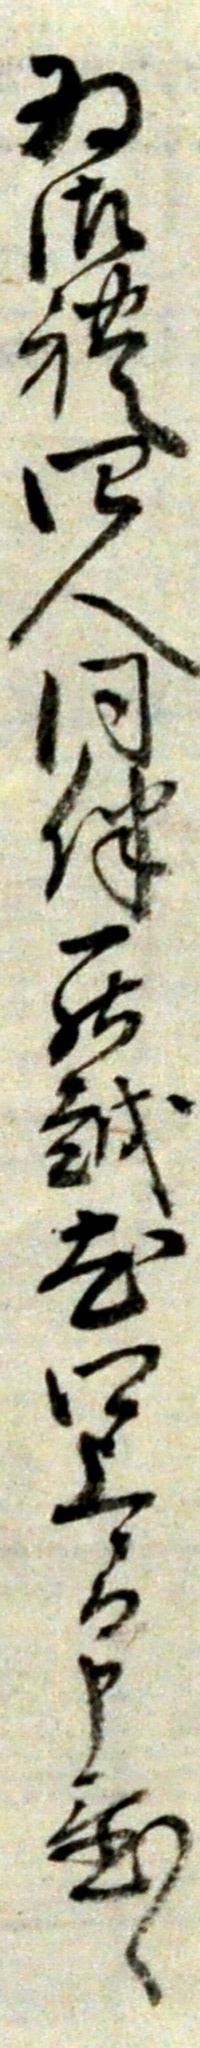為御禮四人同伴罷越尤口上二而申置候
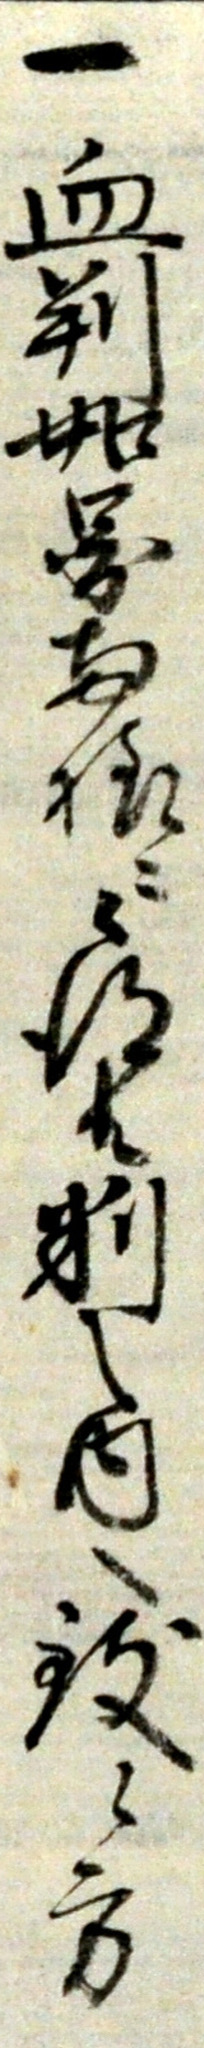一血判如図両様ニ候得共判之内へ致候方
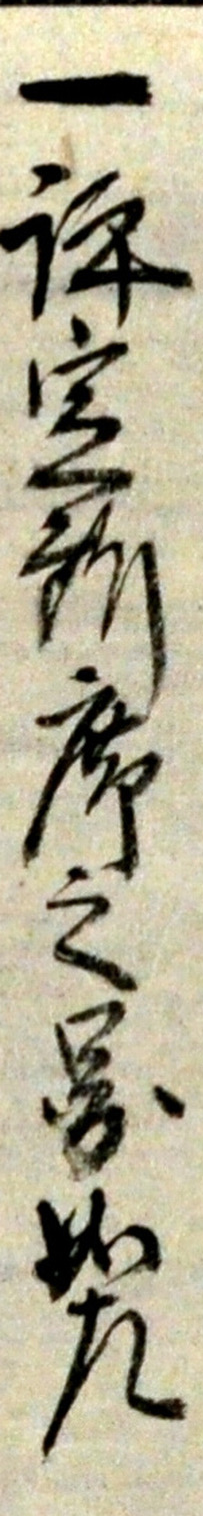一評定所席之図如左

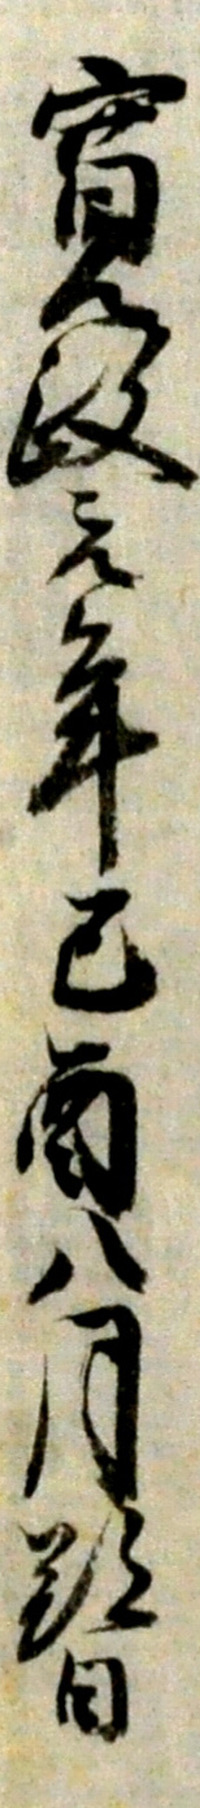寛政元年己酉八月朔日
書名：大阪加番関係諸書留〔一括〕
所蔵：伊那市立高遠町図書館・合同会社AMANE
